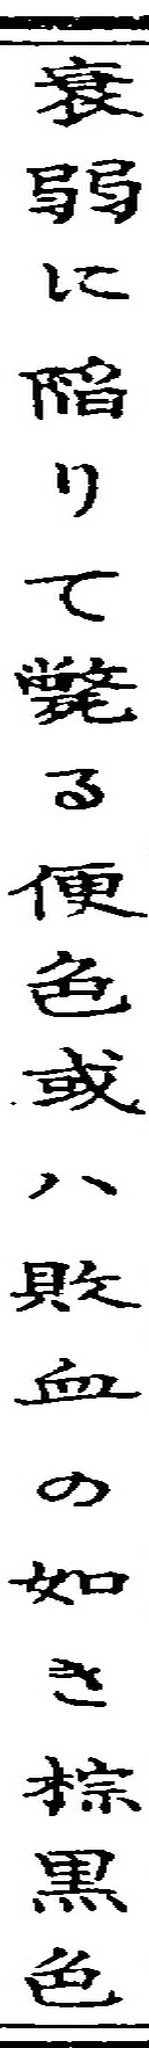衰弱に陥りて斃る便色或は敗血の如き棕黒色
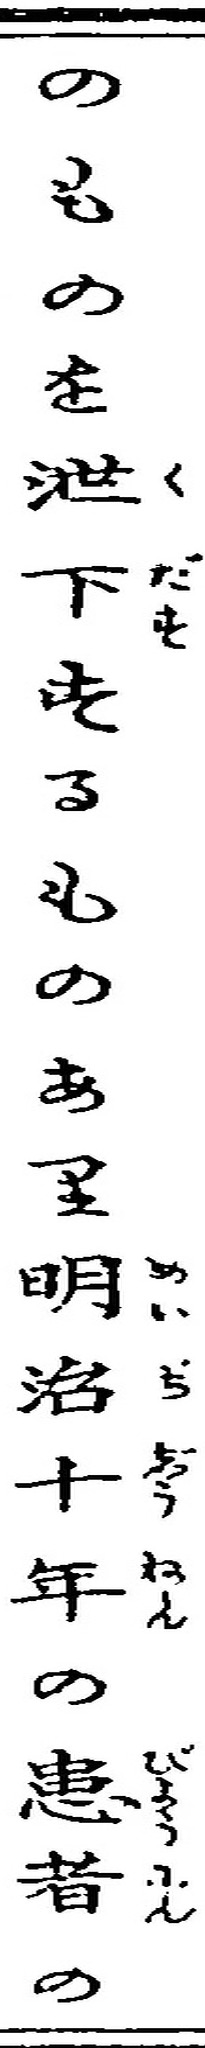のものを泄下するものあり明治十年の患者の
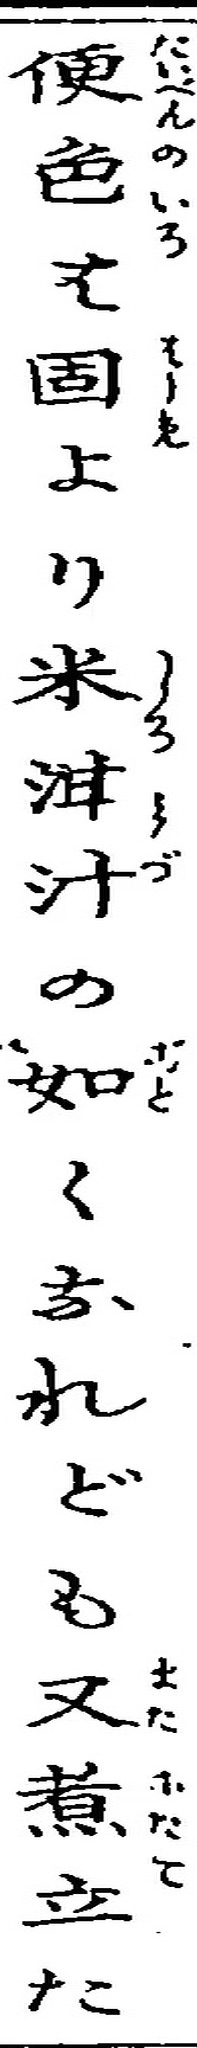便色は固より米洱汁の如くなれども又煮立た
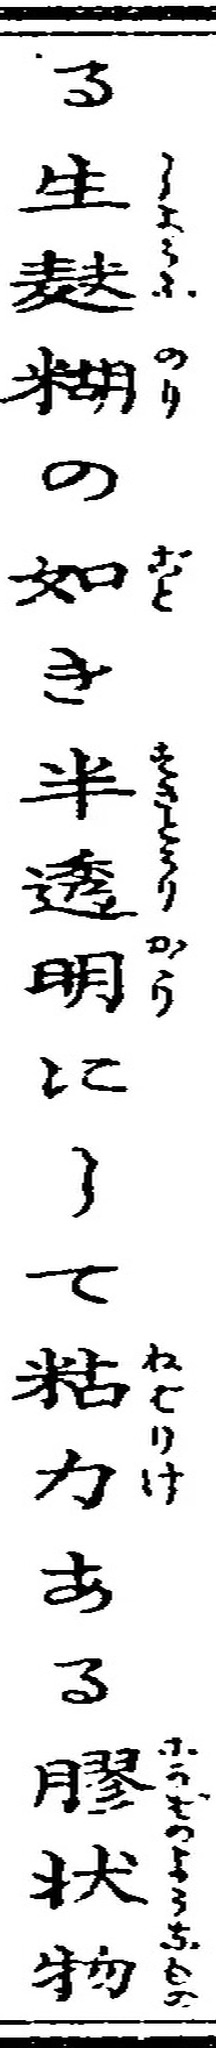る生麩糊の如き半透明にして粘力ある膠状物
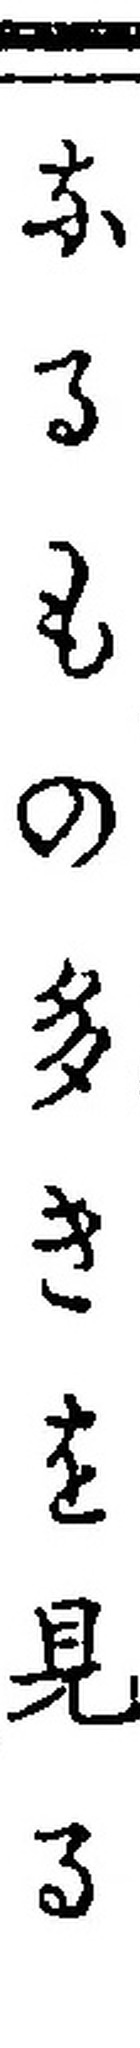なるもの多きを見る
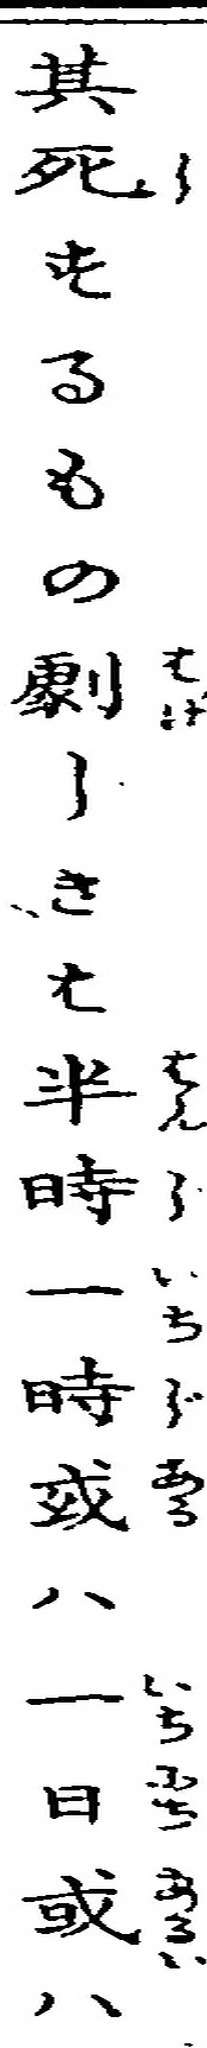其死するもの劇しきは半時一時或は一日或は

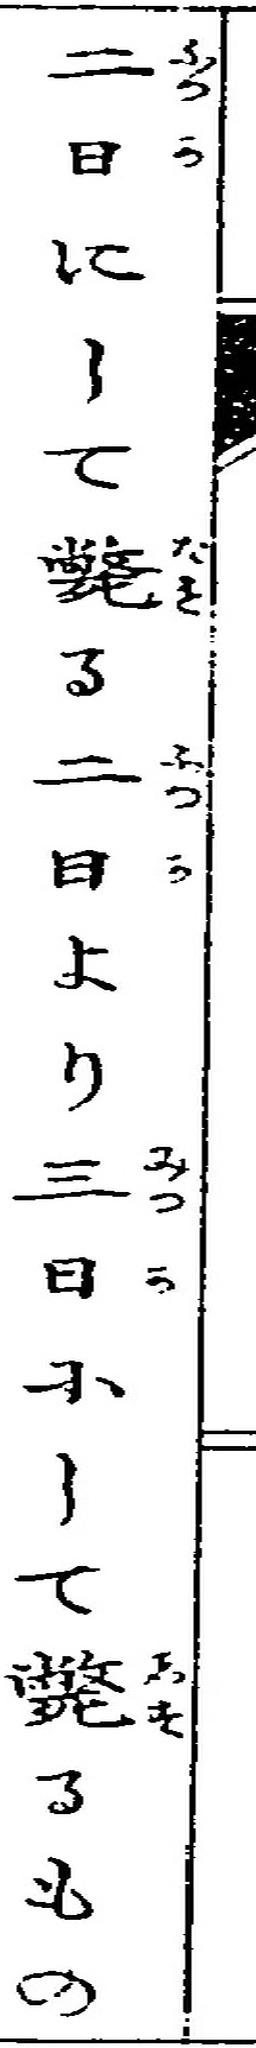二日にして斃る二日より三日にして斃るもの
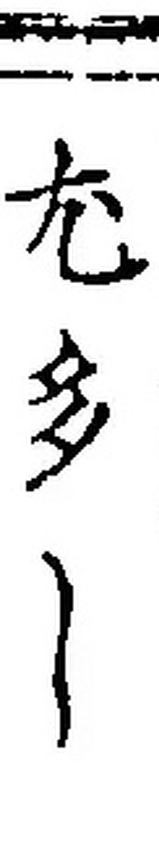尤多し
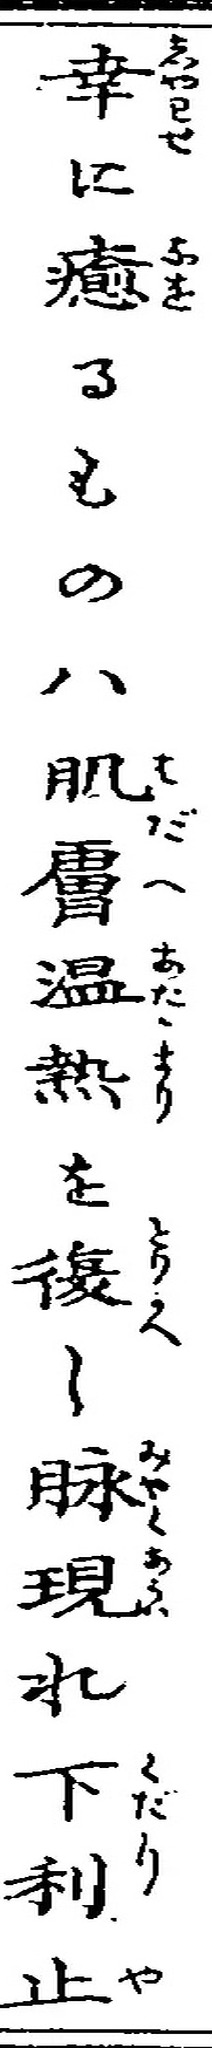幸に癒るのもは肌膚温熱を腹し脉現れ下利止
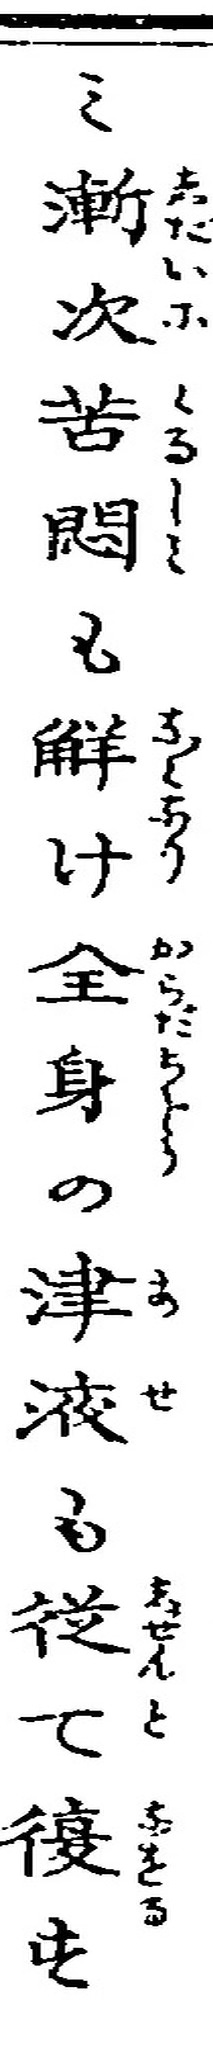み漸次苦悶も鮮け全身の津液も従て腹す
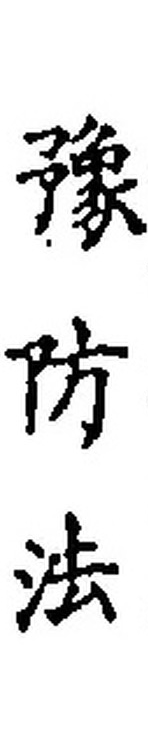豫防法
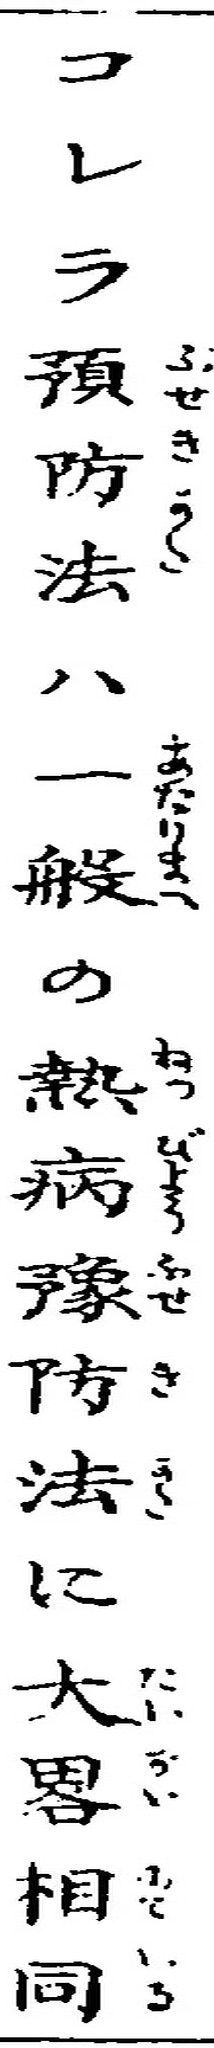コレラ豫防法は一般の熱病豫防法に大畧相同
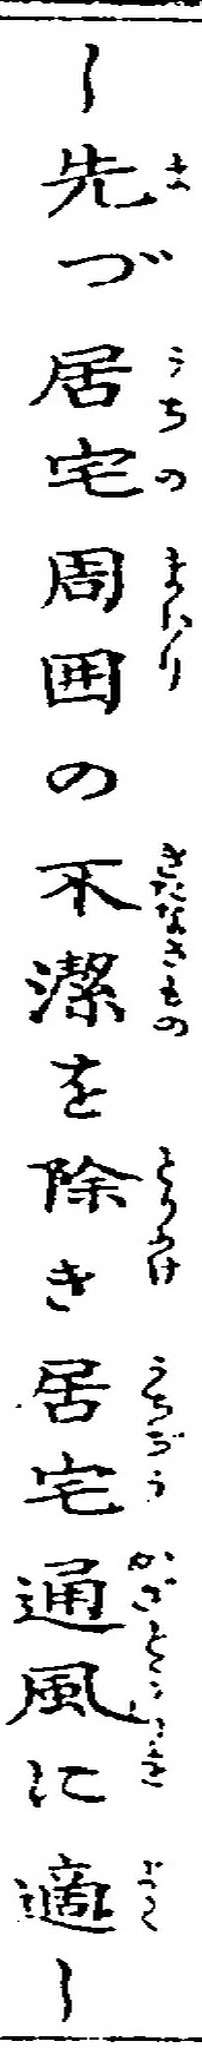し先づ居宅周囲の不潔を除き居宅通風に適し
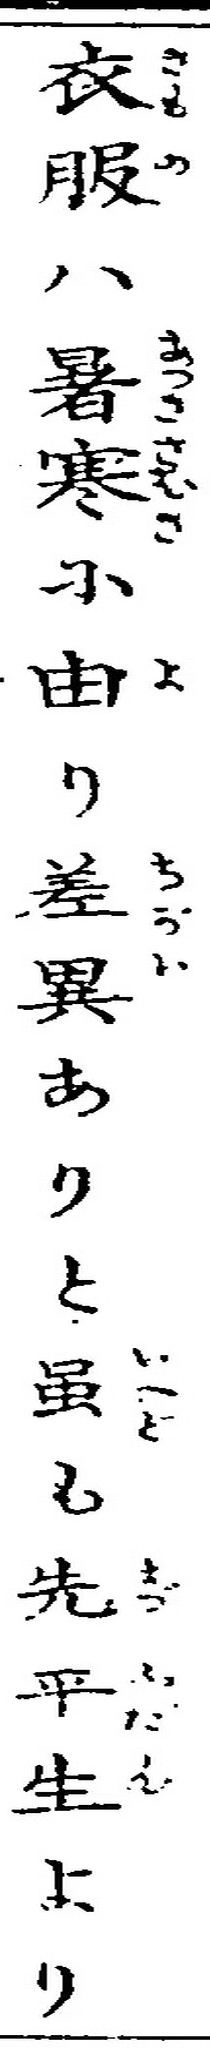衣服は暑寒に由り差異ありと雖も先平生より
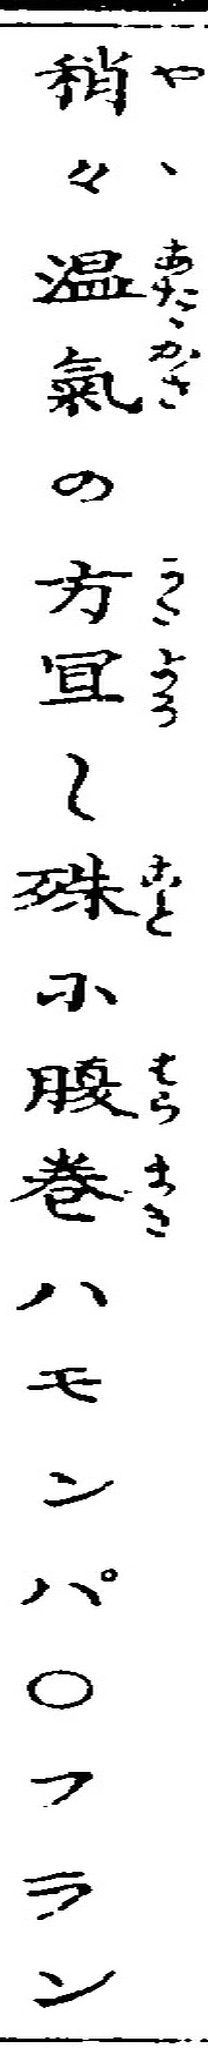稍々温氣の方宜し殊に腹巻はモンパフラン
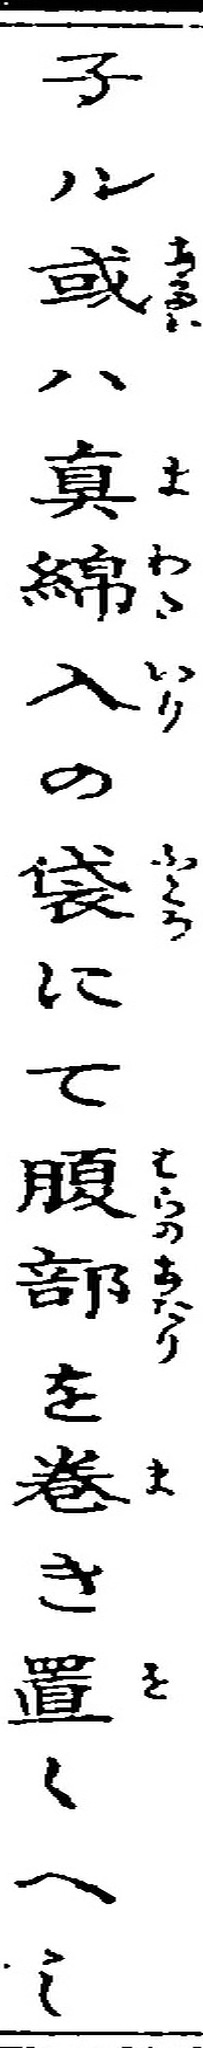ネル或は真綿入の袋にて腹部を巻き置くへし
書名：虎列剌予防民間の心得
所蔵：国立国会図書館 National Diet Library, JAPAN
